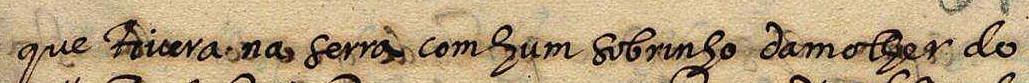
que tiuera na serra com hum sobrinho da molher do
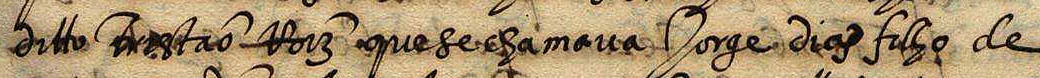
ditto Tristaõ Roiz̄ que se chamaua Jorge diaz filho de
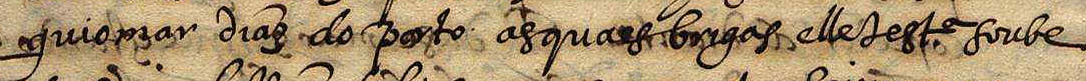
guiomar diaz̄ do porto as quaes brigas elle testa soube
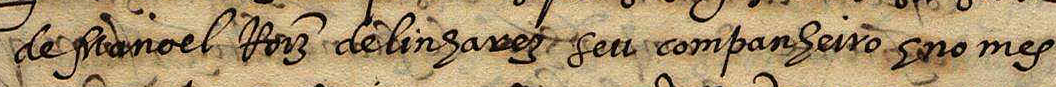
de Manoel Roiz̄ de linharez seu companheiro E no mes
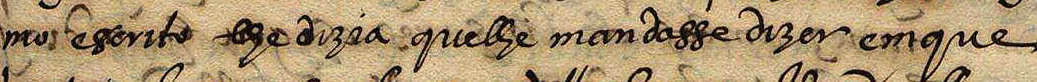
mo escrito lhe dizia que lhe mandasse dizer em que
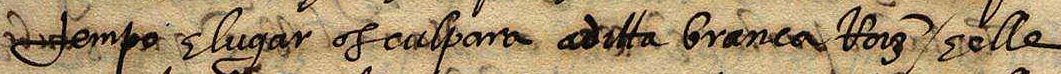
tempo E lugar os culpara a ditta branca Roiz̄ / E elle
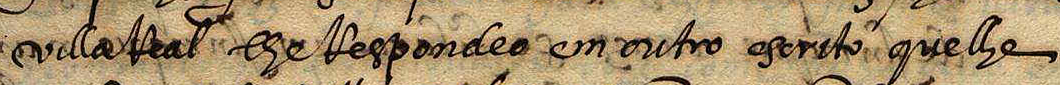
villa Real lhe Respondeo em outro escrito que lhe
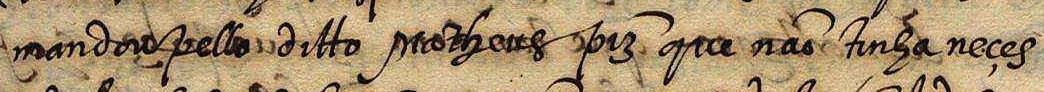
mandou pello ditto Matheus piz̄ que naõ tinha neçes
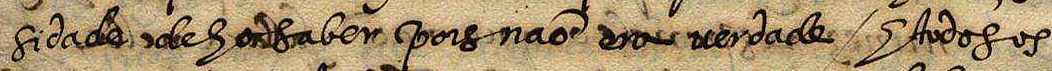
sidade de ho saber pois naõ era uerdade / E todos os
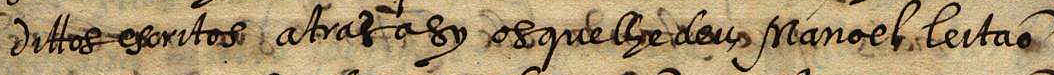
dittos escritos atras asy os que lhe deu Manoel leitaõ
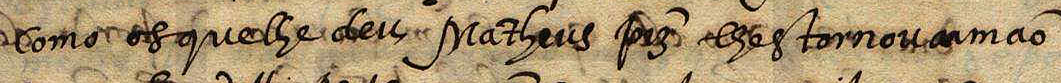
como os que lhe deu Matheus piz̄ lhes tornou aa maõ
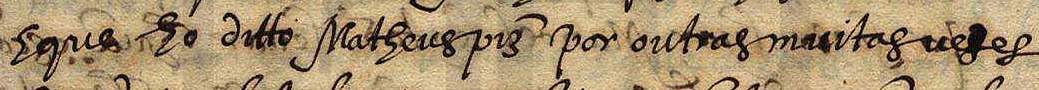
E que do ditto Matheus piz̄ por outras muitas ueses
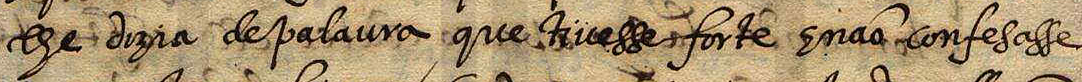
lhe dizia de palaura que tiuesse forte E naõ confesasse
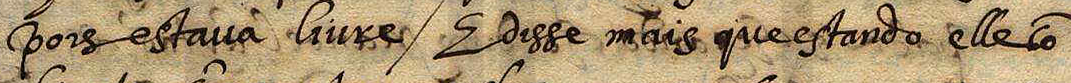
pois estaua liure / E disse mais que estando elle cō
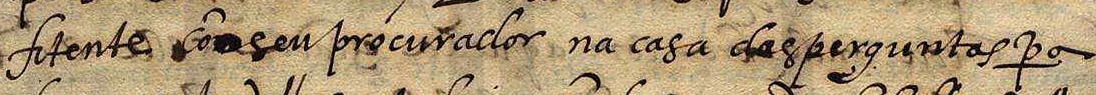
fitente cō_ seu procurador na casa das perguntas ꝑa
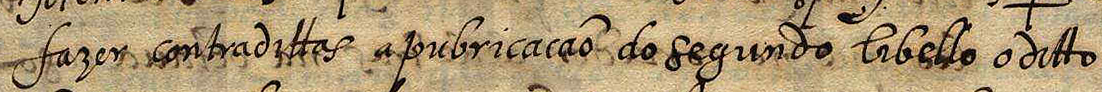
fazer contradittas a pubricacaõ do segundo libello o ditto
